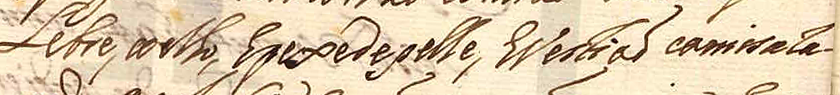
Lebre, coelho, E pexe de pelle, E vestiaõ camisa la
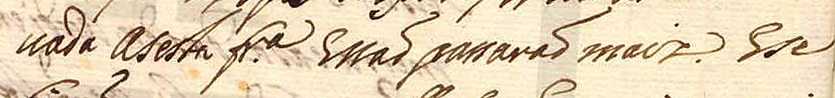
uada a sesta fr.a E naõ passaraõ mais. E se
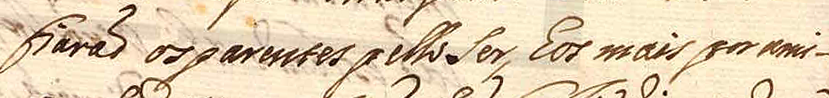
fiaraõ os parentes pello ser, E os mais por ami
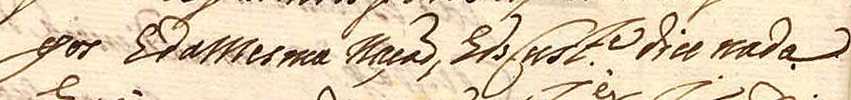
gos, E da mesma nação, E do Cust.e dice nada.
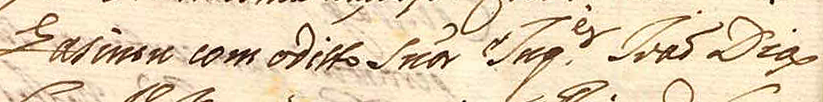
E asinou com o ditto snōr Inq.or Ioaõ Dias
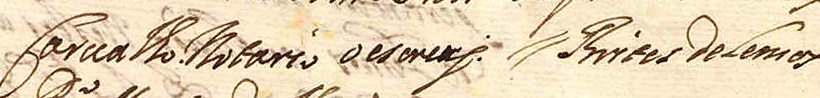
Carualho Notario o escreuj. = Brites de Lemos
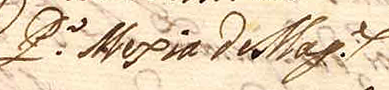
P.o Mexia de Mag.es
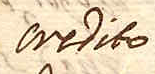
credito
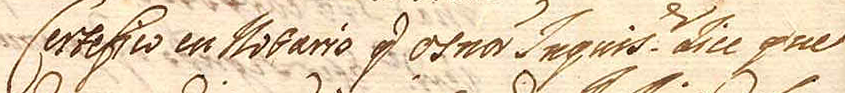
Certefico eu Notario q̄ o snor̄ Inquis.or dice que
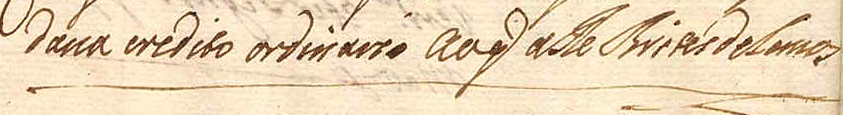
daua credito ordinario ao q̄ a Re Brites de Lemos
